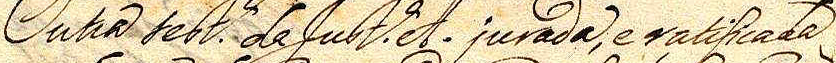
Outra test.a de Just.a A. jurada, e ratificada
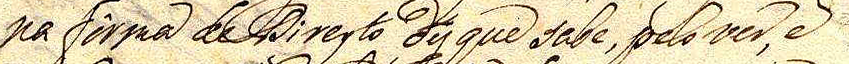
na fôrma de Direyto dis que sabe, pelo ver, e
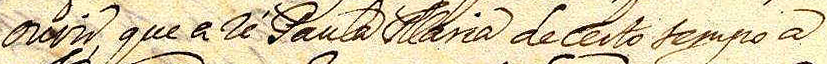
ouvir, que a Ré Paula Maria de certo tempo a
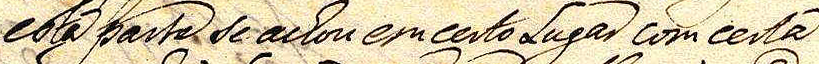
esta parte se achou em certo Lugar com certa
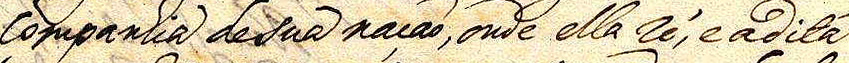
companhia de sua naçaõ, onde ella Ré, e a dita
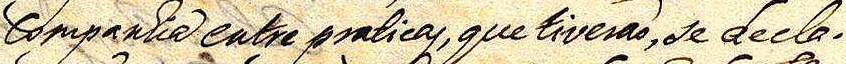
companhia entre praticas, que tiveraõ se decla
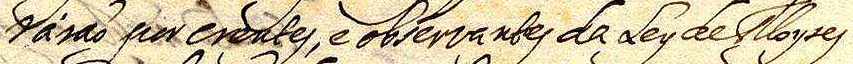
raraõ por crentes, e observantes da Ley de Moyzes
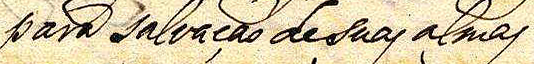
para salvaçaõ de suas almas.
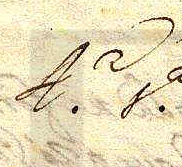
4.a t.a
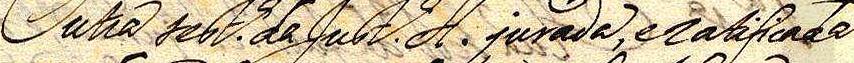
Outra test.a da Just.a A. jurada, e Ratificada
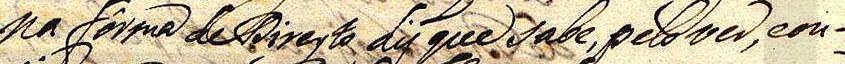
na fôrma de Direyto dis que sabe, pelo ver, e ou
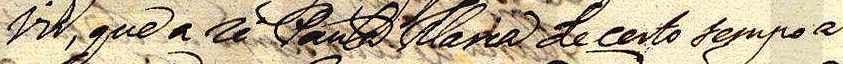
vir, que a Ré Paula Maria de certo tempo a
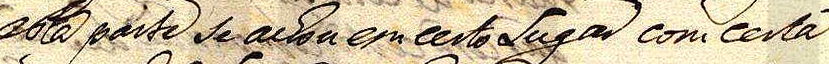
esta parte se achou em certo Lugar com certa
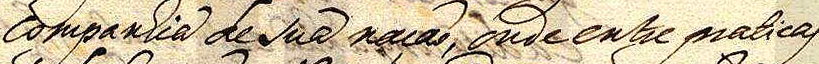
companhia de sua naçaõ, onde entre praticas
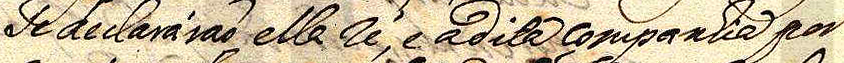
se declaráraõ ella Ré, e a dita companhia por
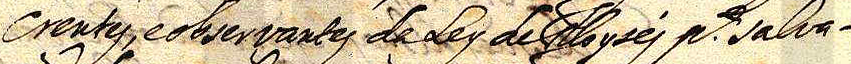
crentes, e observantes da Ley de Moyzés p.a salva
